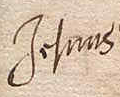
Jejuus
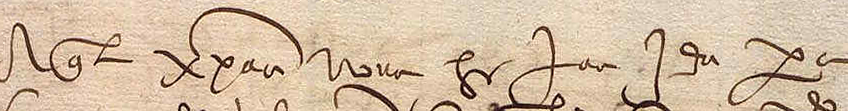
A q̄L xp̄aa noua he Jaa Jda ꝑa
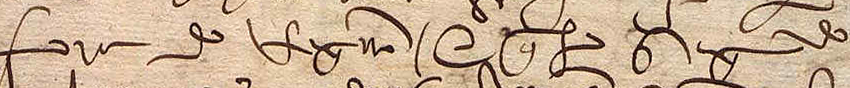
fora do Regn̄o / E q̄ ho seḡdo
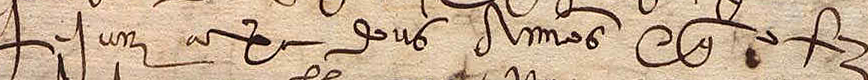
JeJum aꝟa dous Annōs e q̄ o fez
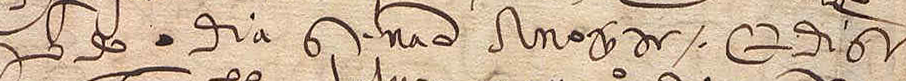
todo o dia senão A noyte /. E dise
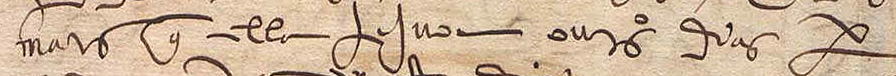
mais q̄ ella JeJuou outso dias ꝑ
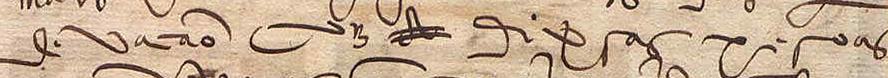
devacão com _ diꝟsas pesoas
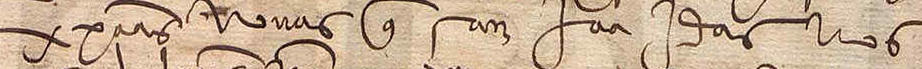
xpaās nouas q̄ sam Jaa Jdas nos
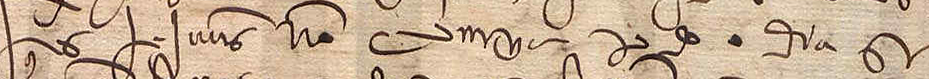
q̄ os JeJuūs nō comya todo o dia se
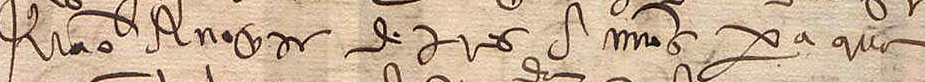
não A noyte de tres Ann̄os ꝑa qua
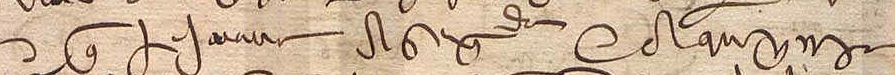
e q̄ JeJuaua A seḡda e A quynta
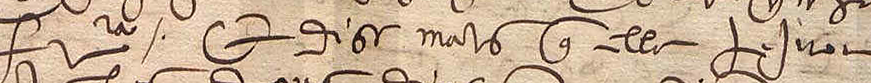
frra /. E dise majs q̄ ella JeJuou
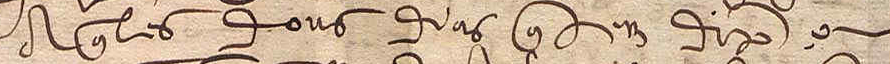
Aq̄les dous dias q̄ tem dito ou
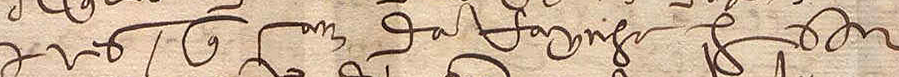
tres / q̄ sam da Raynha hester
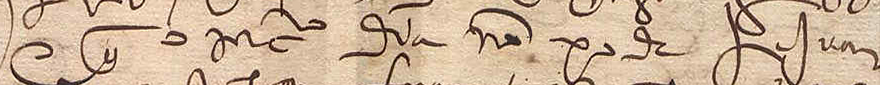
E q̄ o tercro dia nō pode JeJuar
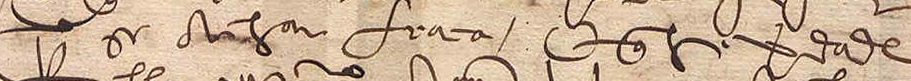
ꝑo se Achar fraca /. E q̄ he ꝟdade
